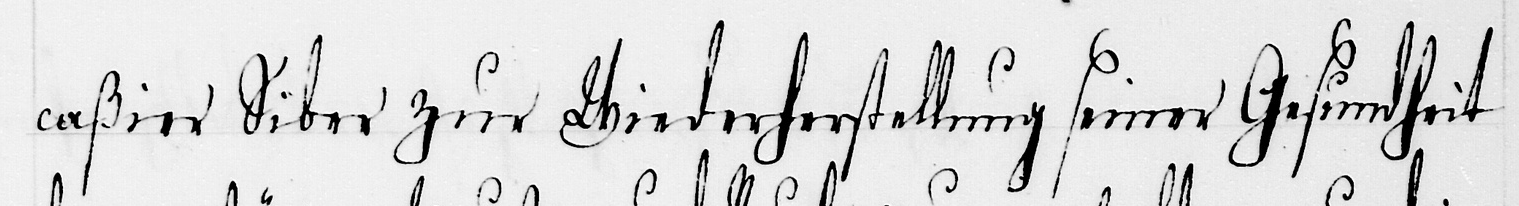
caßier Siber zur Wiederherstellung seiner Gesundheit
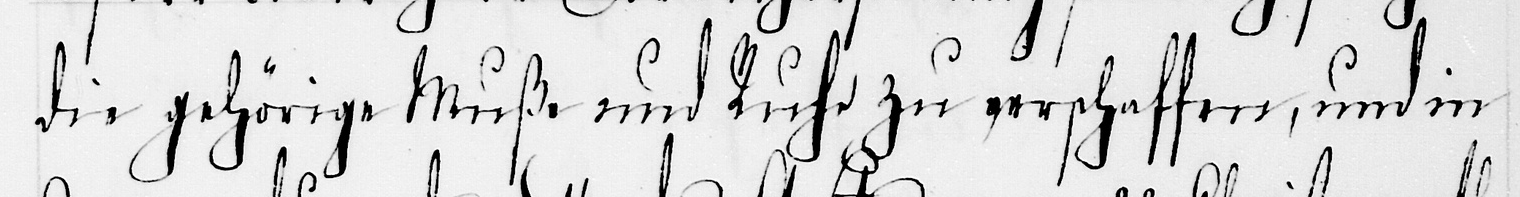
die gehörige Muße und Ruhe zu verschaffen, und in
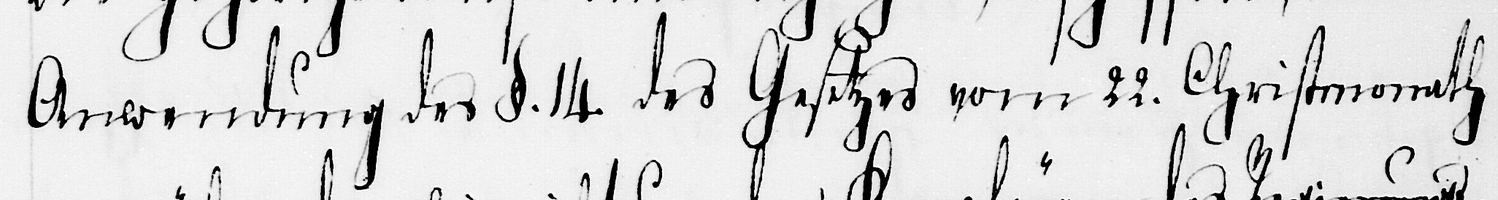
Anwendung des §. 14. des Gesetzes vom 22. Christmonath
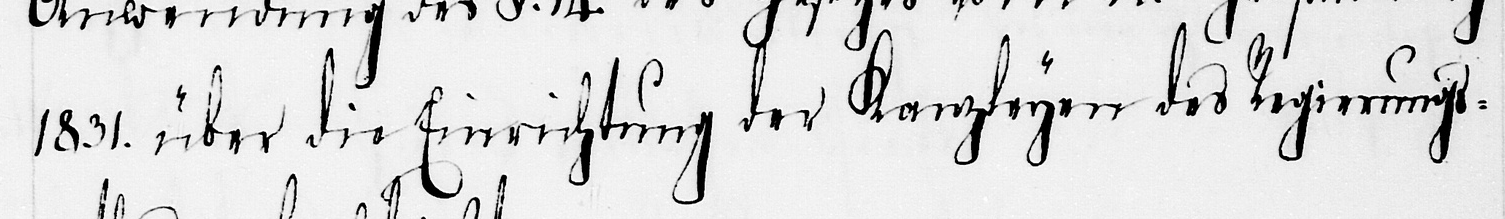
1831. über die Einrichtung der Kanzleyen des Regierungs¬
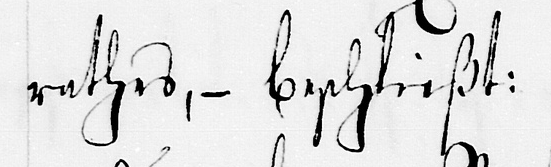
rathes, − beschließt:
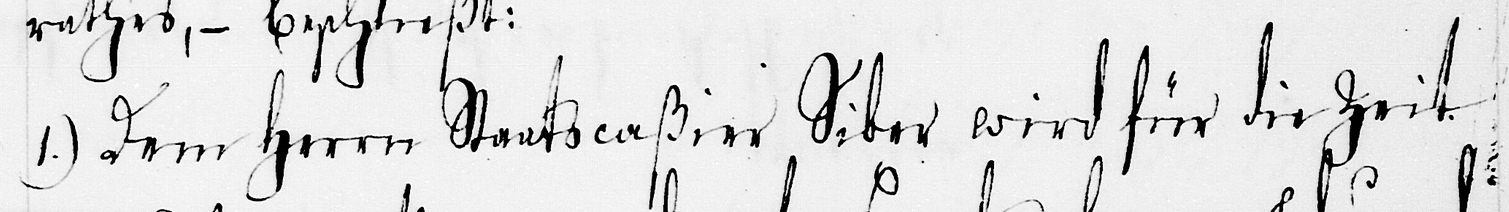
1.) Dem Herrn Staatscaßier Siber wird für die Zeit
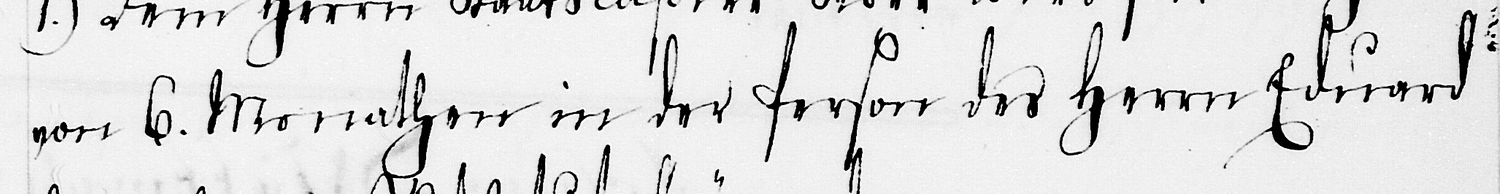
von 6. Monathen in der Person des Herrn Eduard
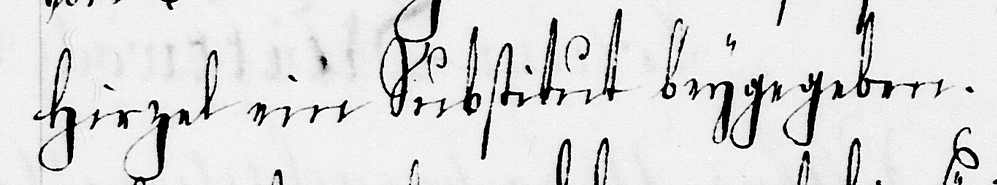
Hirzel ein Substitut beygegeben.
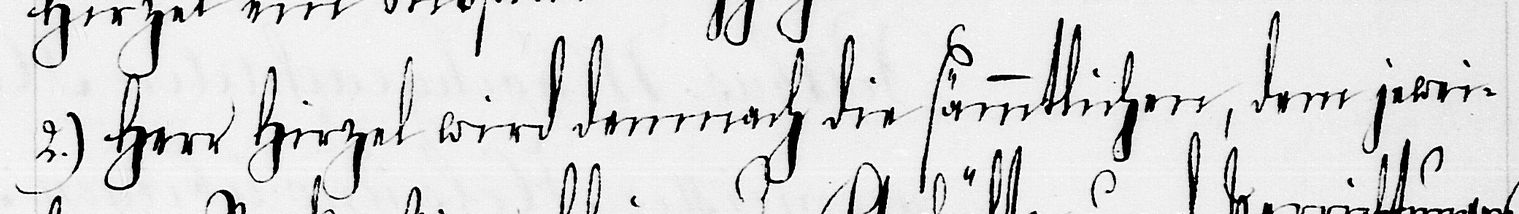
2.) Herr Hirzel wird demnach die sämmtlichen, dem jewei¬
